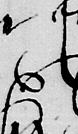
des
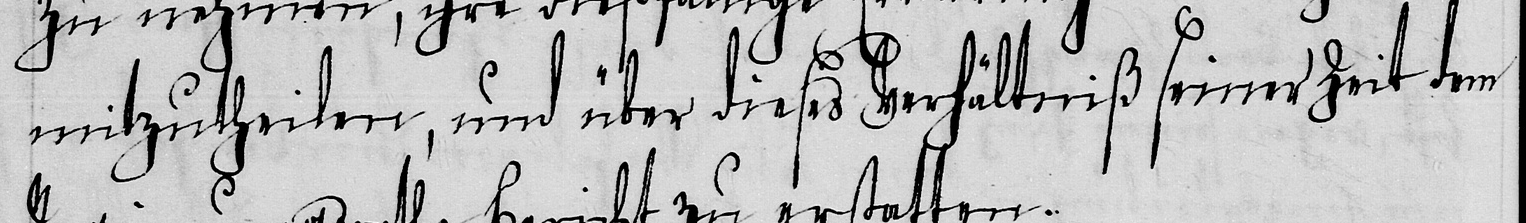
mitzutheilen, und über dieses Verhältniß seiner Zeit dem
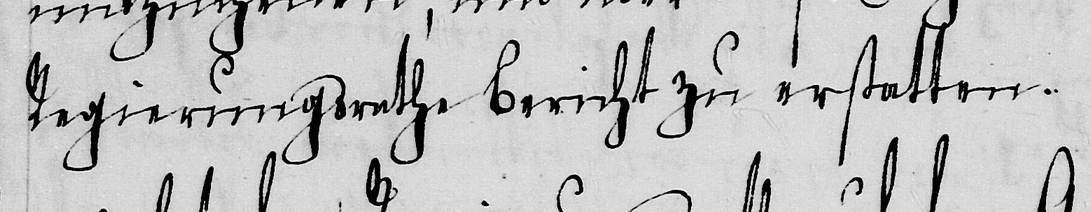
Regierungsrathe Bericht zu erstatten.
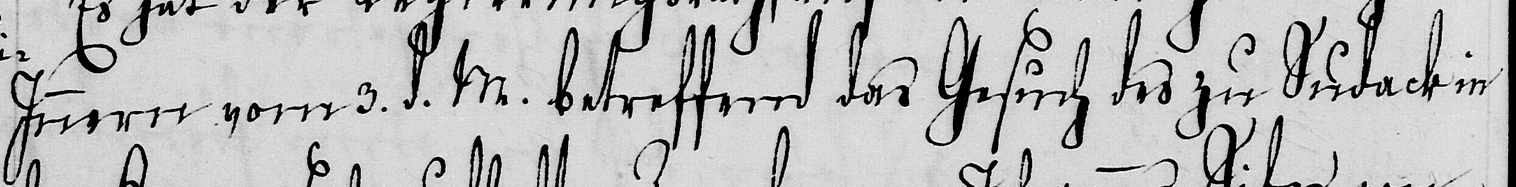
Innern vom 3. d. M. betreffend das Gesuch des zu Sudack in
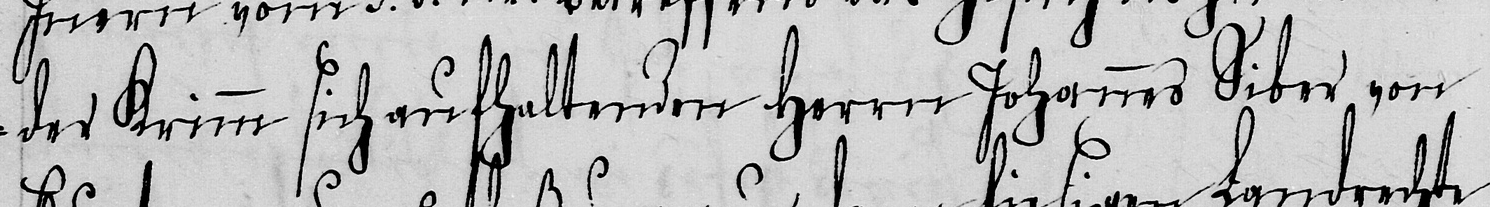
der Krimm sich aufhaltenden Herrn Johannes Siber von
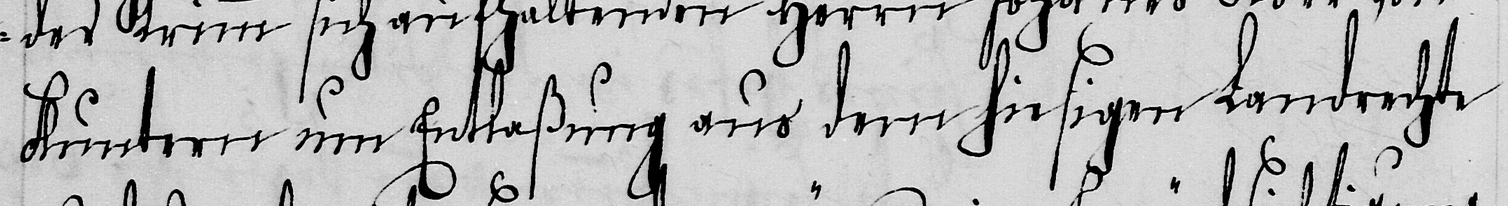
Fluntern um Entlaßung aus dem hiesigen Landrechte
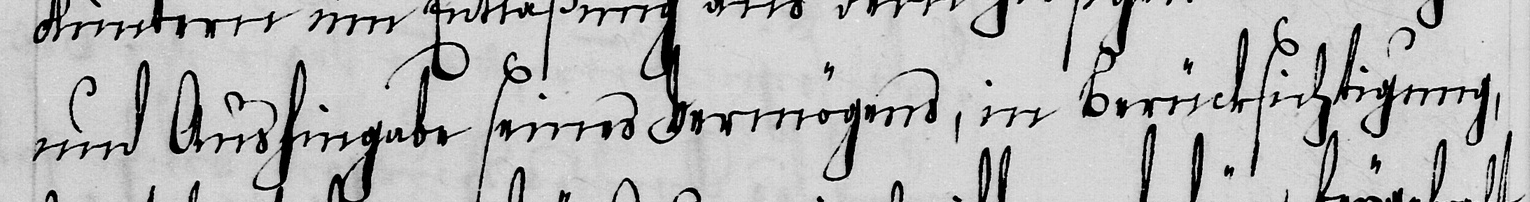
und Aushingabe seines Vermögens, in Berücksichtigung,
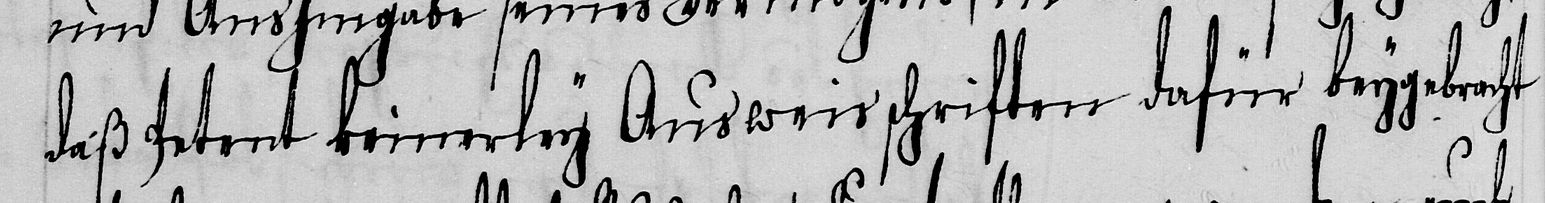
daß Petent keinerley Ausweisschriften dafür beygebrac¬
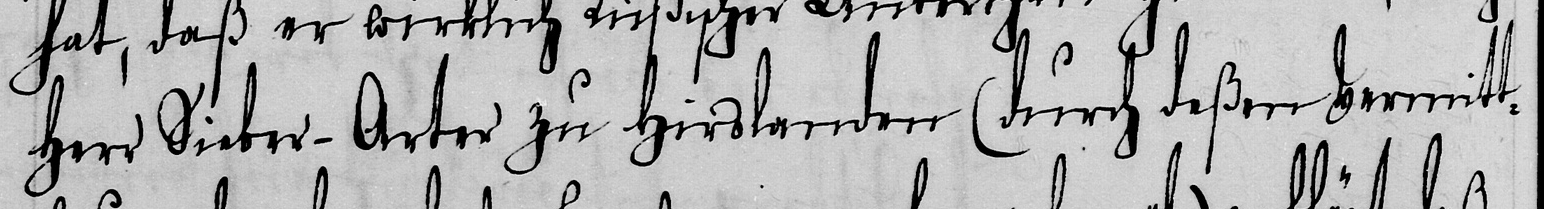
Herr Sieber-Arter zu Hirslanden (durch deßen Vermitt¬
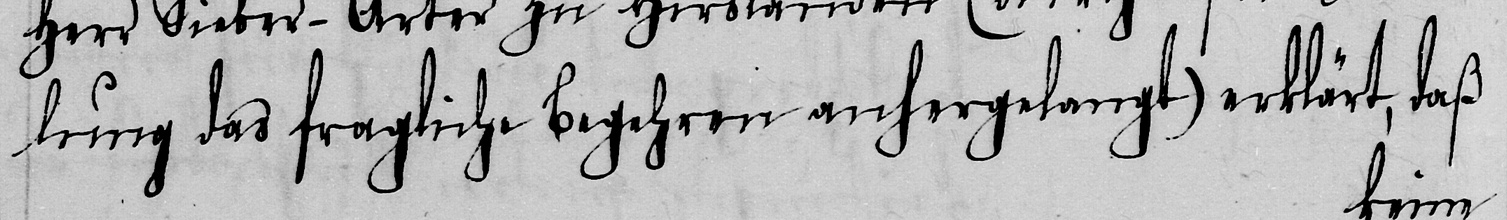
lung das fragliche Begehren anhergelangt) erklärt, daß
